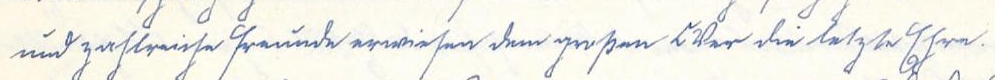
und zahlreiche Freunde erwiesen dem großen CVer die letzte Ehre.
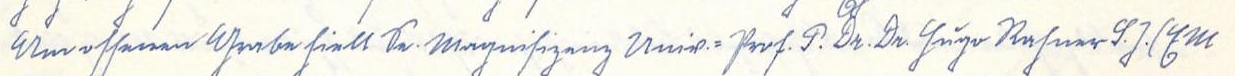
Am offenen Grabe hielt Se. Magnifizenz Univ. – Prof. P. Dr. Hugo Rahner S. J. (EM
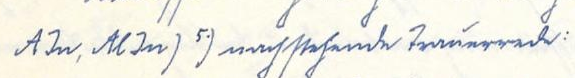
A In, Al Ib) 5) nachstehende Trauerrede:
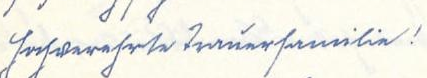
Hochverehrte Trauerfamilie!
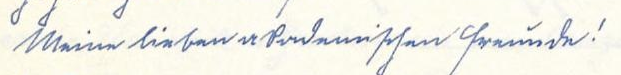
Meine lieben akademischen Freunde!
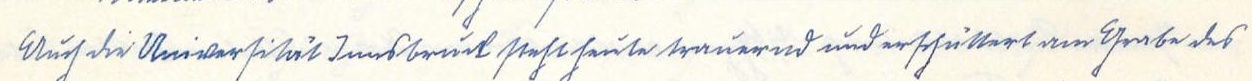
Auch die Universität Innsbruck steht heute trauernd und erschüttert am Grabe des
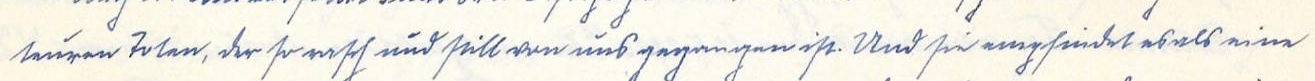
teuren Toten, der so rasch und still von uns gegangen ist. Und sie empfindet es als eine
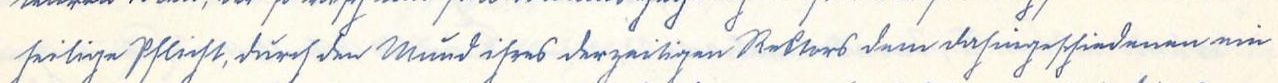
heilige Pflicht, durch den Mund ihres derzeitigen Rektors dem Dahingeschiedenen ein
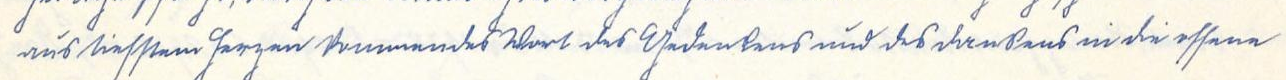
aus tiefstem Herzen kommendes Wort des Gedenkens und des Dankens in die offene
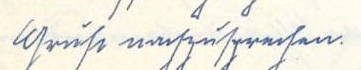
Gruft nachzusprechen.
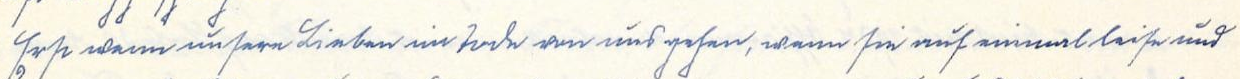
Erst wenn unsere Lieben im Tode von uns gehen, wenn sie auch einmal leise
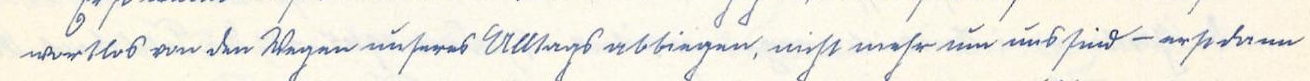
und wortlos von den Wegen unseres Alltags abbiegen, nicht mehr unter uns sind - erst dann
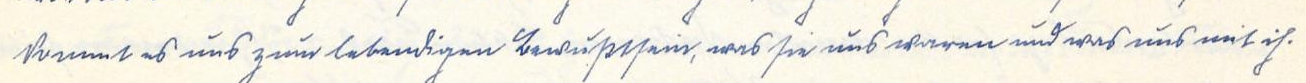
kommt es uns zum lebendigen Bewußtsein, was sie uns waren und was uns mit ih-
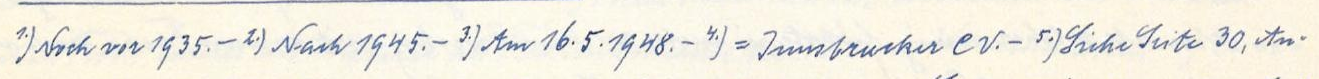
1) Noch noch vor 1935.- 2) Nach 1945.- 3) Am 16.5.1948. – 4) = Innsbrucker CV. – 5) Siehe Seite 30 An-
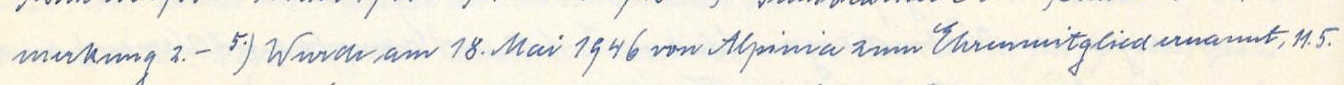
merkung 2.- 5) wurde am 18. Mai 1946 von Alpinia zum Ehrenmitglied ernannt, 11. 5
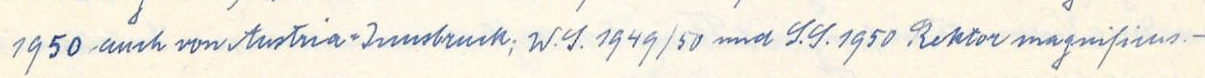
1950 auch von Austria-Innsbruck; W.S. 1949/50 und S. S. 1950 Rektor magnificus.-
